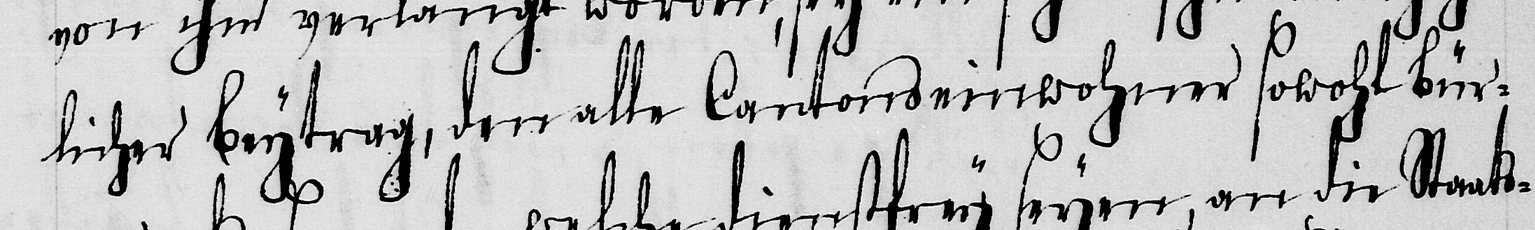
licher Beytrag, den alle Cantonseinwohner sowohl Bür¬
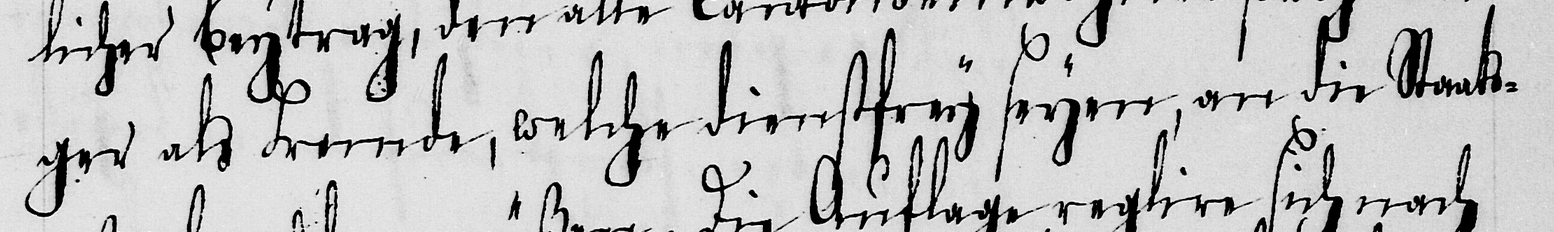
ger als Fremde, welche dienstfrey seyen, an die Staats¬
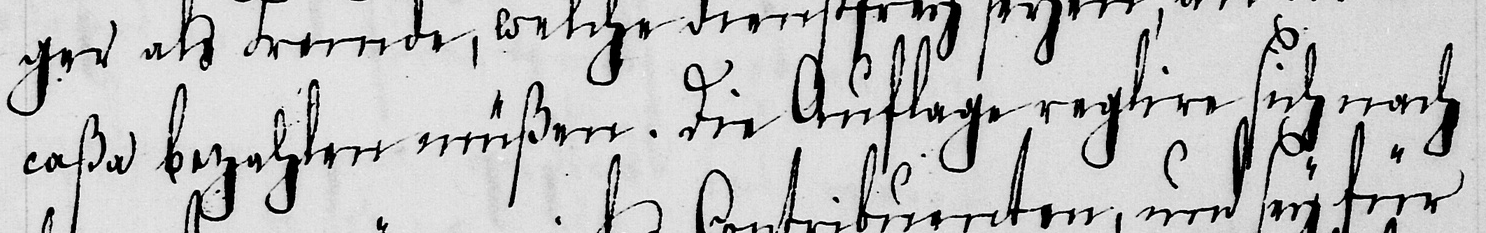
caßa bezahlen müßen. Die Auflage reglire sich nach
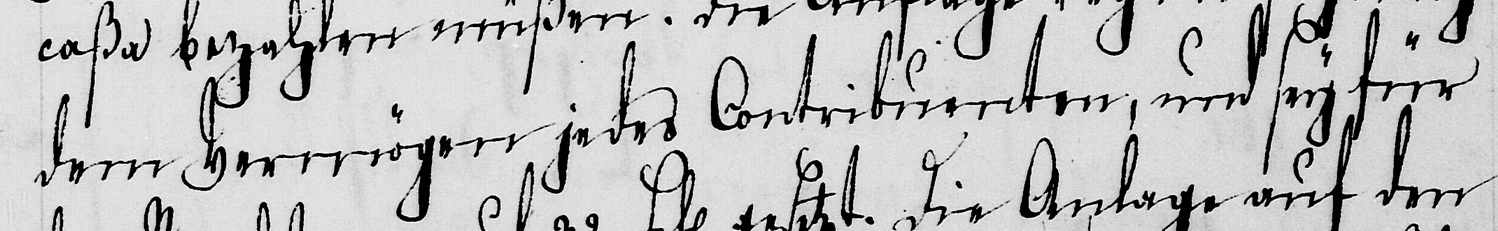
dem Vermögen jedes Contribuenten, und sey für
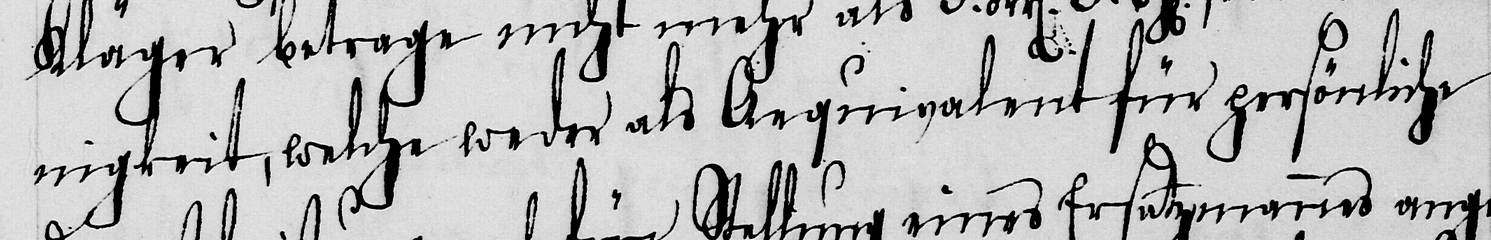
nigkeit, welche weder als Aequivalent für persönliche
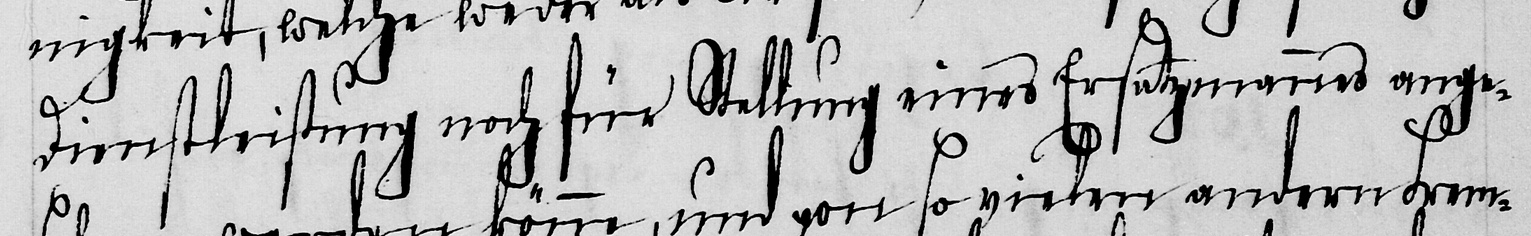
Dienstleistung noch für Stellung eines Ersatzmannes
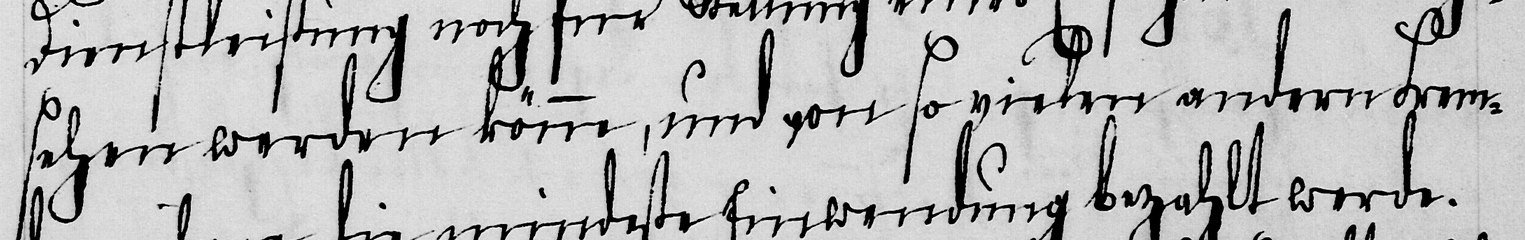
sehen werden könne, und von so vielen andern Frem¬
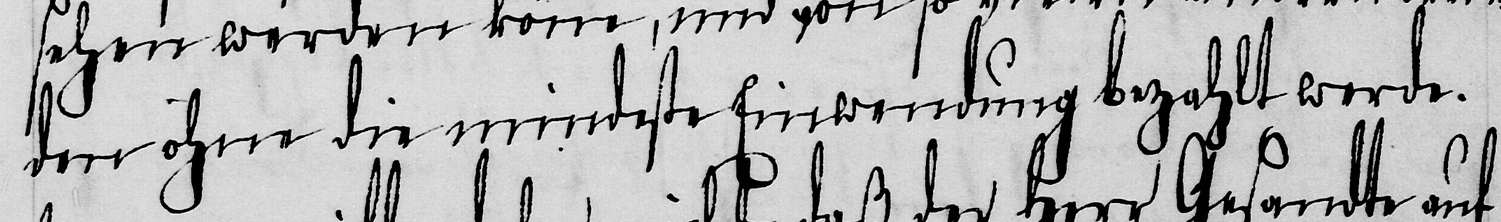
den ohne die mindeste Einwendung bezahlt werde.
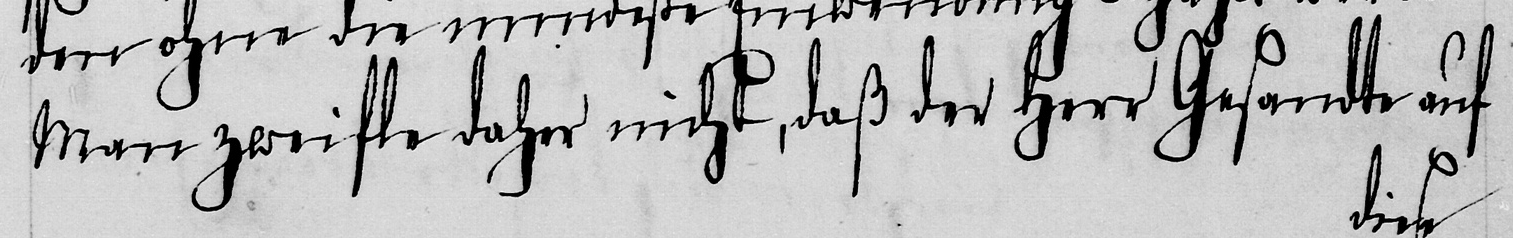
Man zweifle daher nicht, daß der Herr Gesandte auf
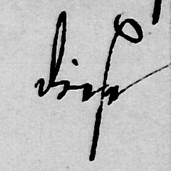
eine
